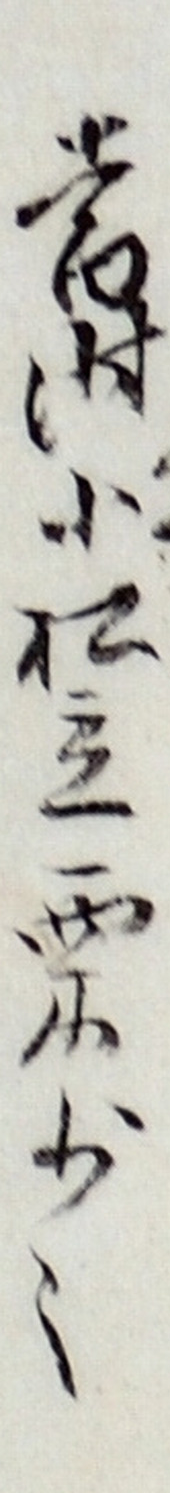当時小松立栗少々
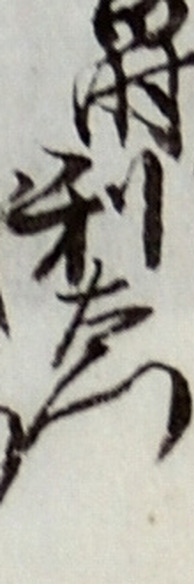武右衛門
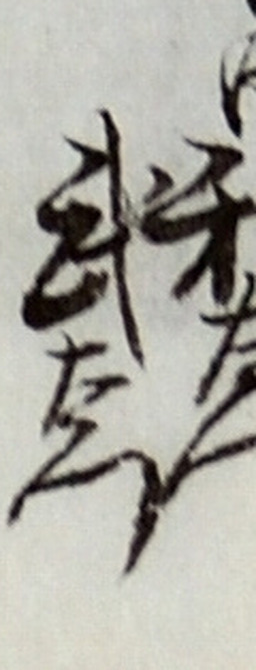武右衛門
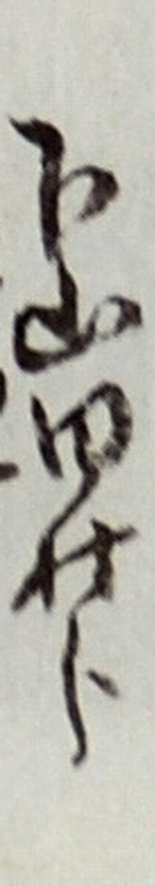上山田村分
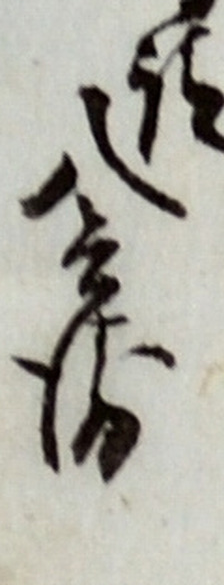八兵衛
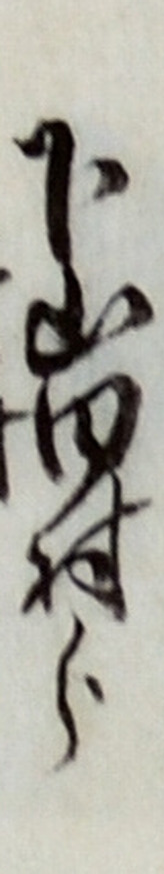上山田村分
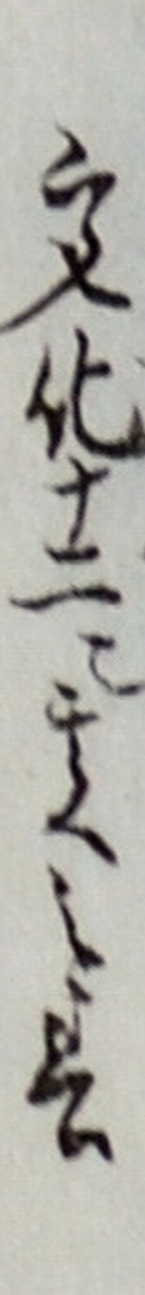文化十二乙亥之春

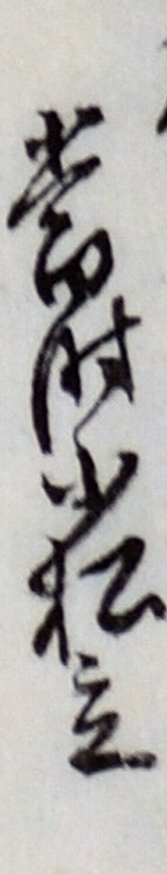当時小松立
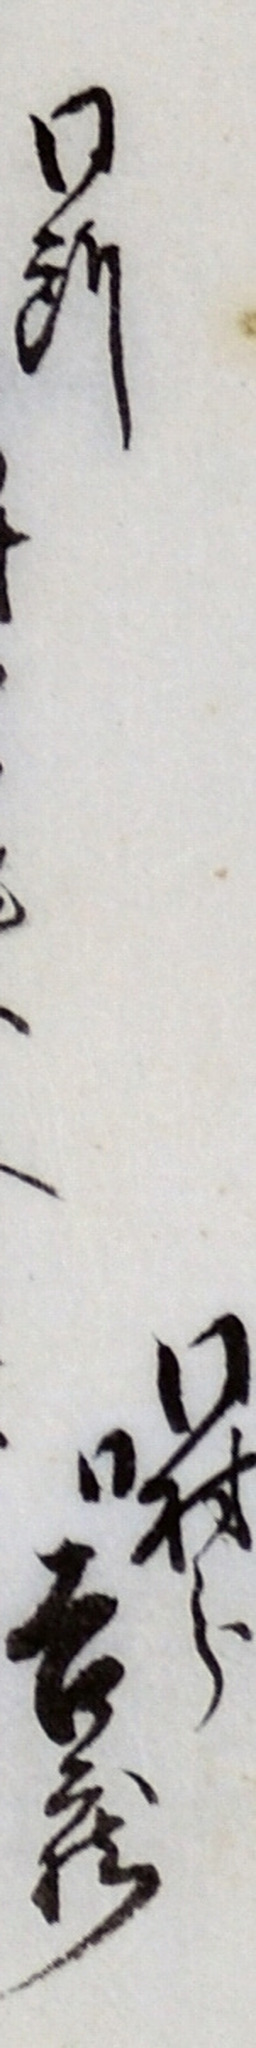同所同村分
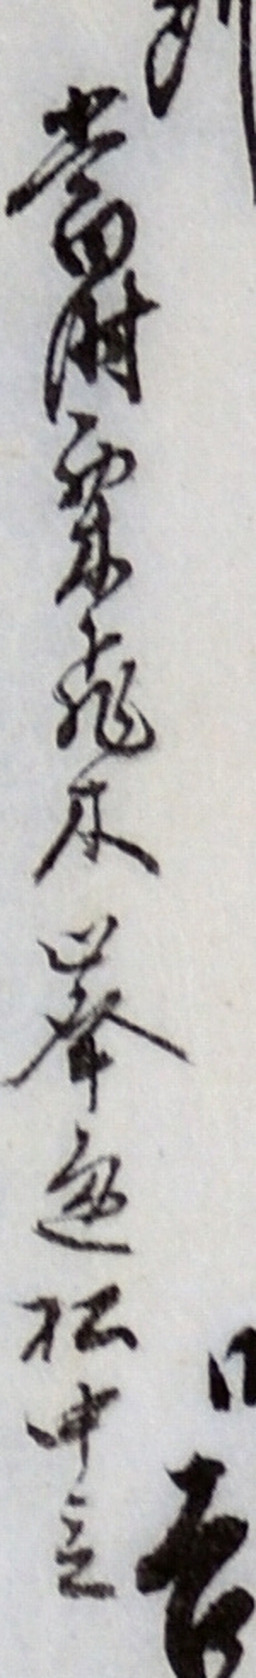当時栗飛木峯通松中立
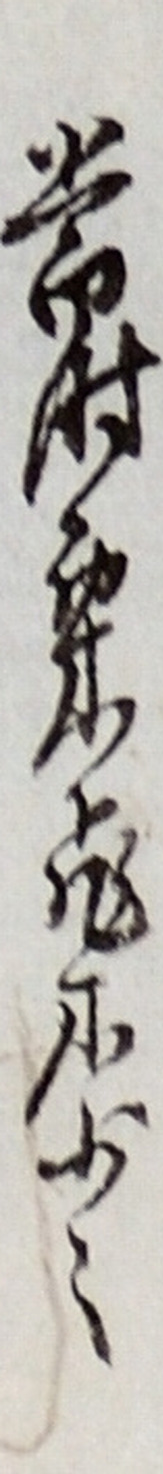当時栗飛木少々
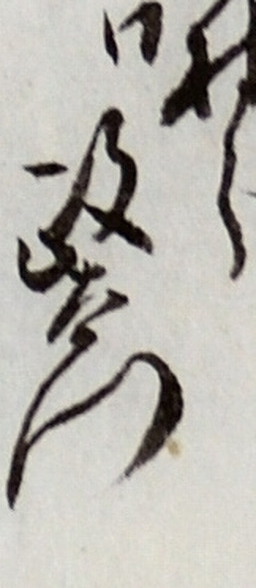武右衛門
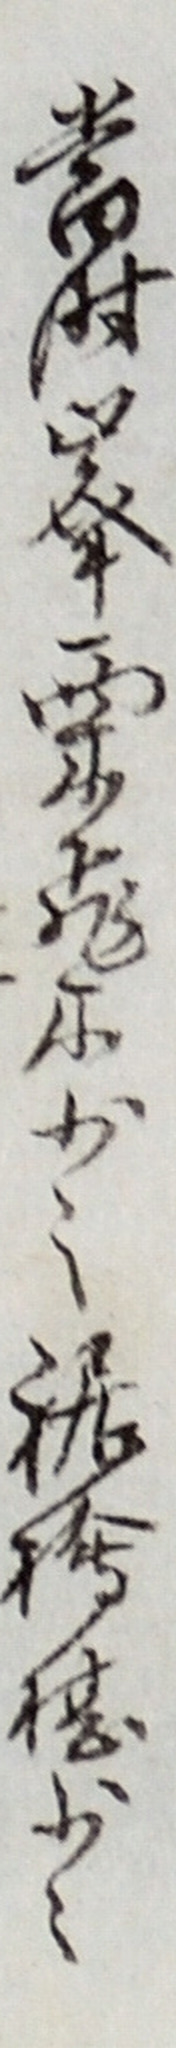当時峯栗飛木少々裾檜椹少々
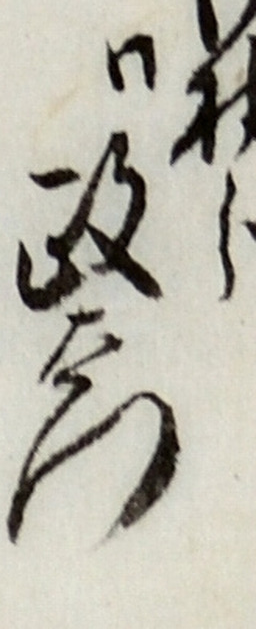武右衛門
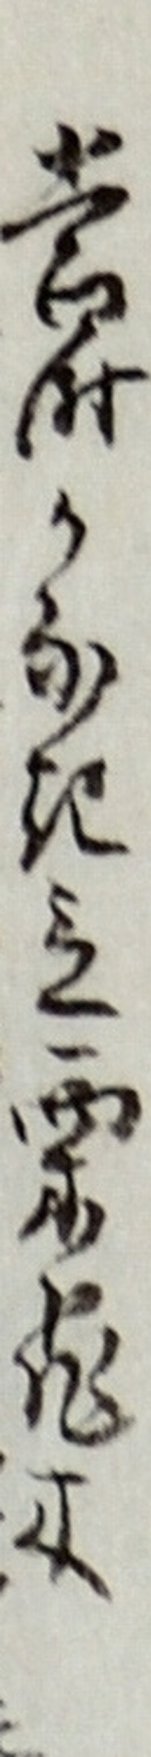当時かなき立栗飛木
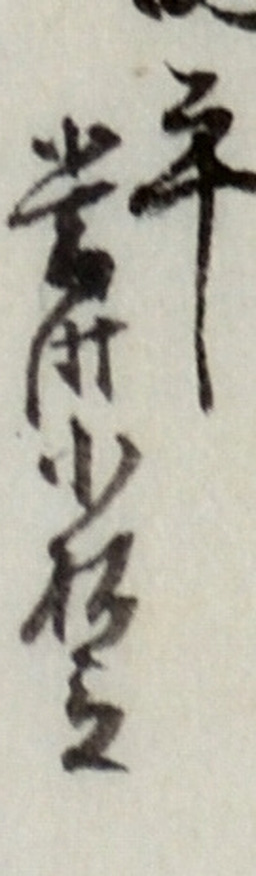当時小松立
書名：郷中御林御竹薮名所附守之名前帳
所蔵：伊那市立高遠町図書館・合同会社AMANE
